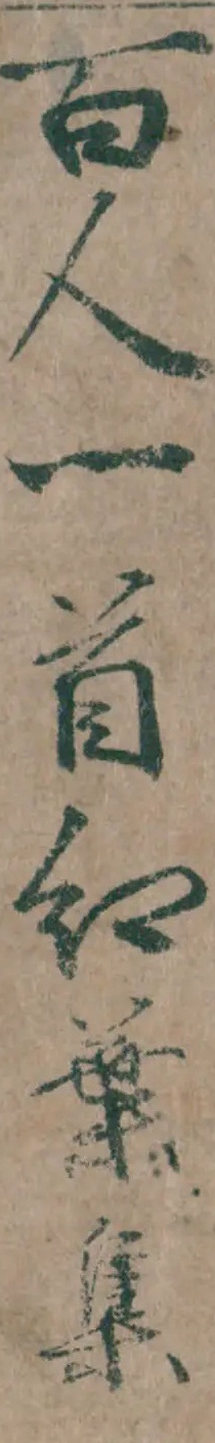百人一首紅葉集全

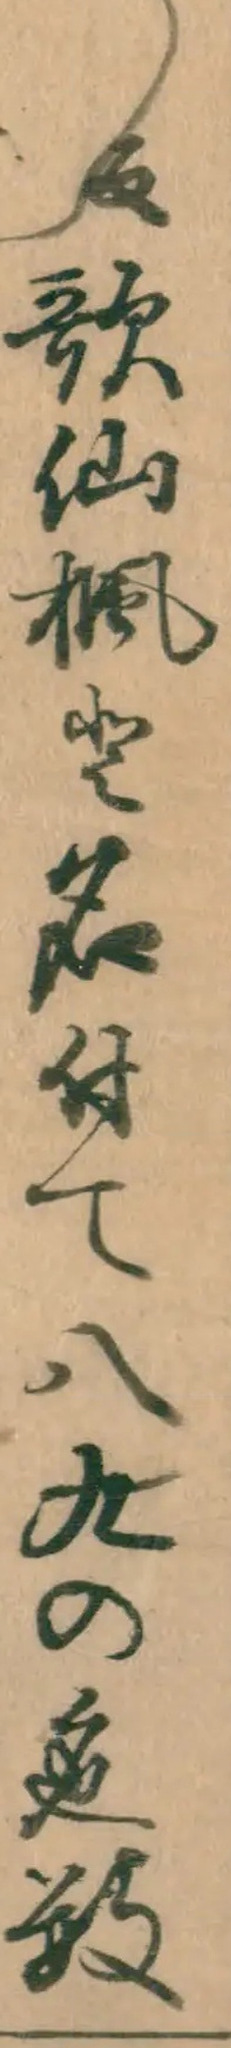歌仙楓と名付て八九の色数
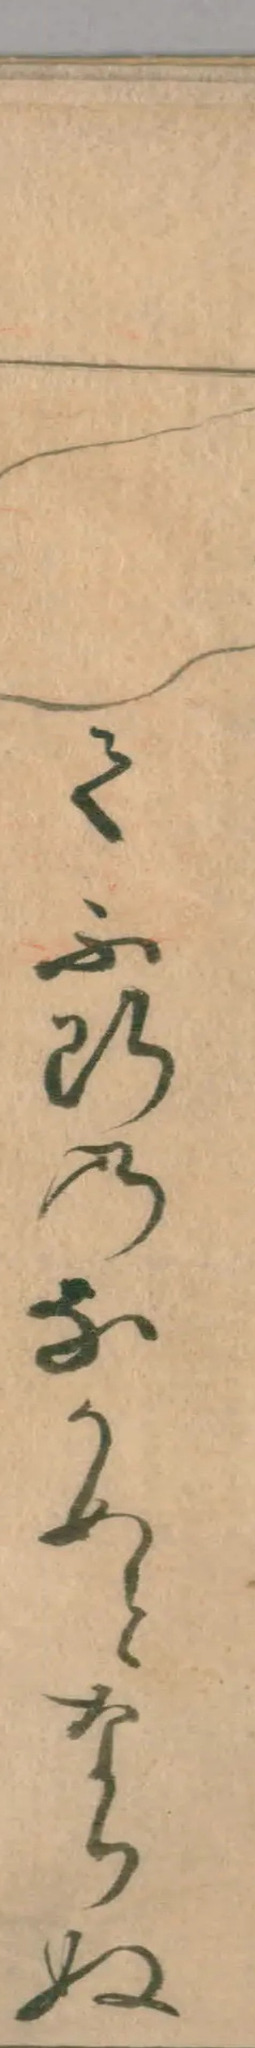て不断のなかめとなりぬ
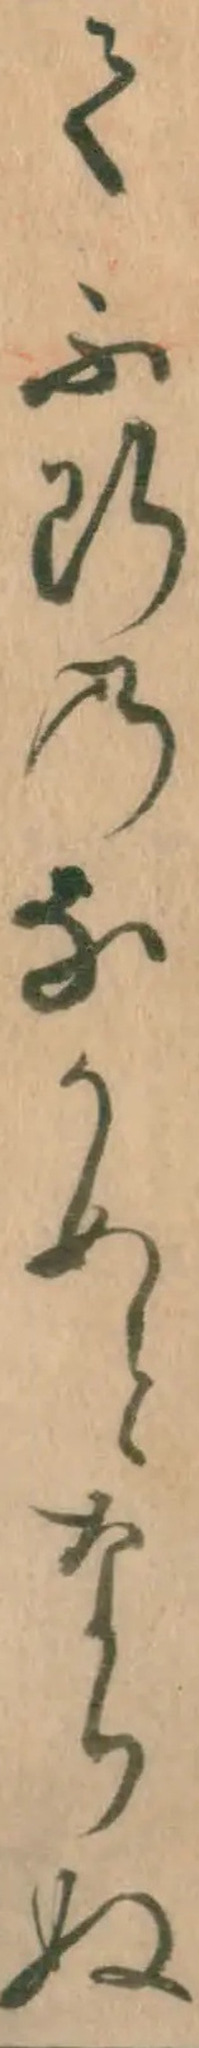て不断のなかめとなりぬ
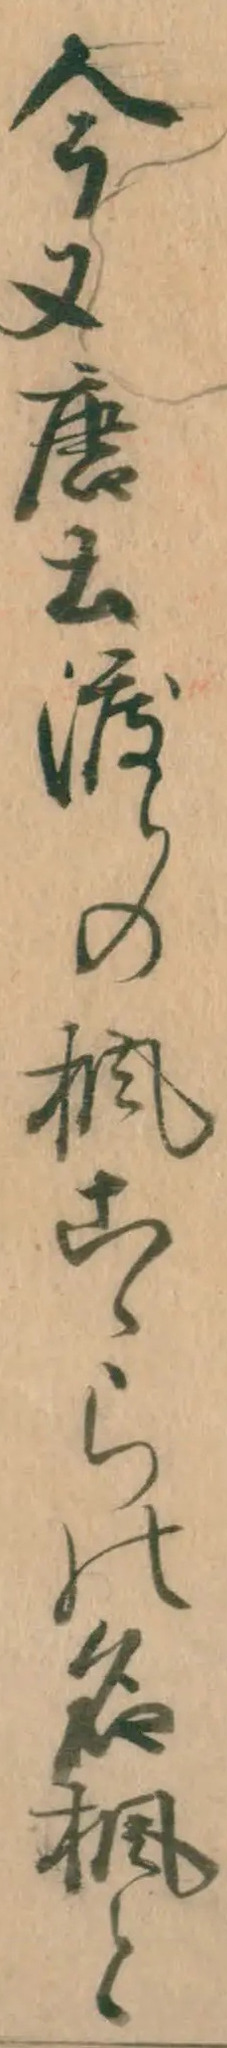今又唐土渡りの楓こゝらの名楓と
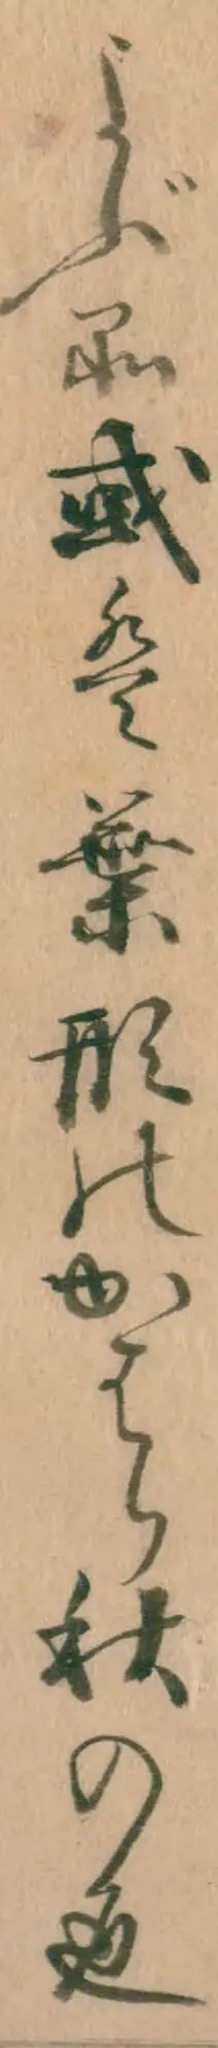よぶ品或は葉形のかはり秋の色
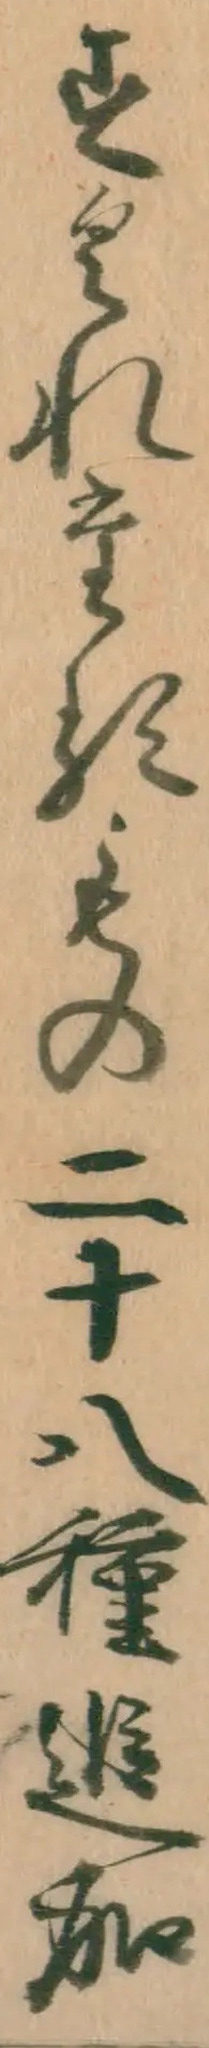すくれたるもの二十八種追加
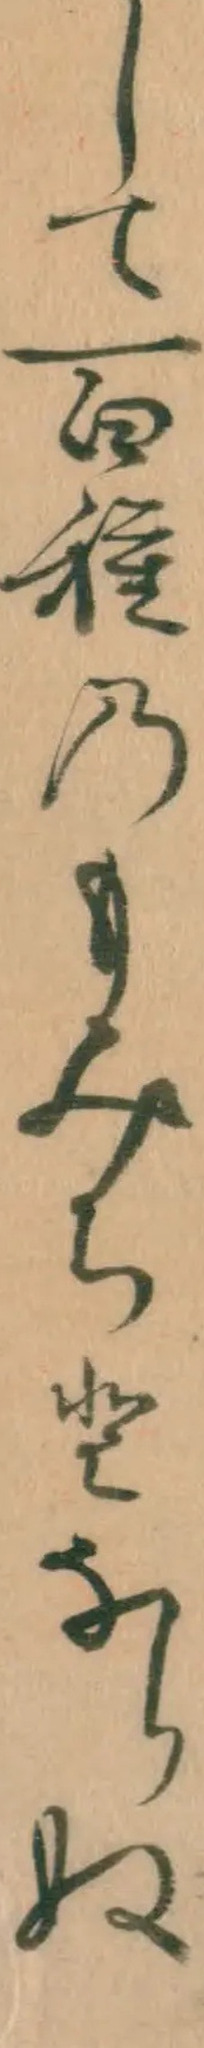して百種のもみちとなりぬ
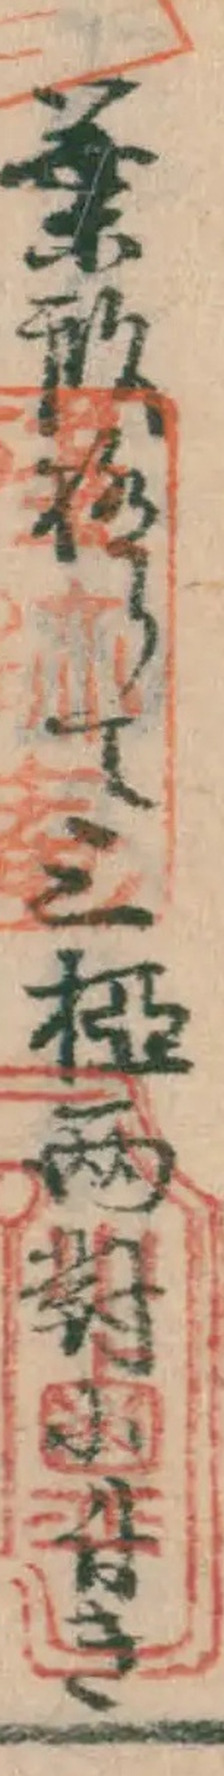唐楓葉形極りて三椏両対に付き
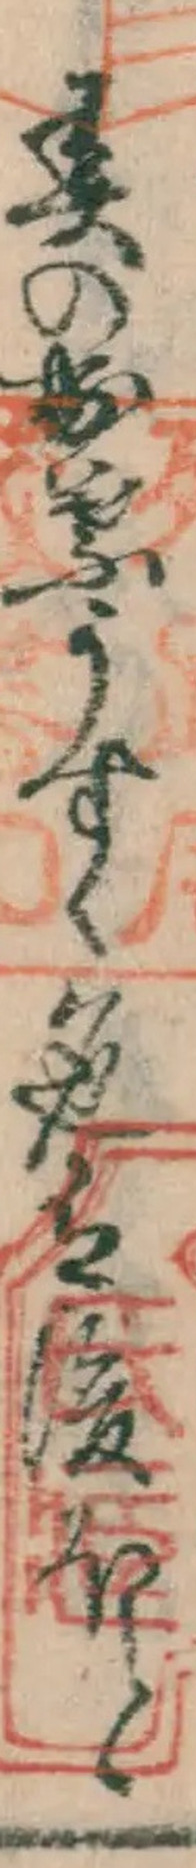春の出葉うすく色有後ほと
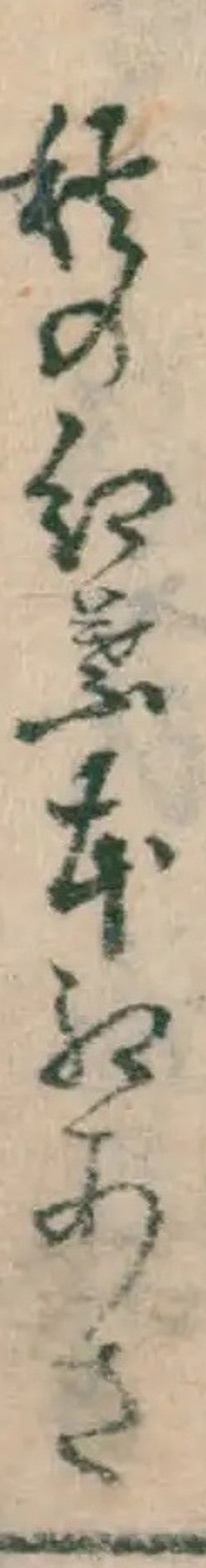秋の紅葉本紅あさ
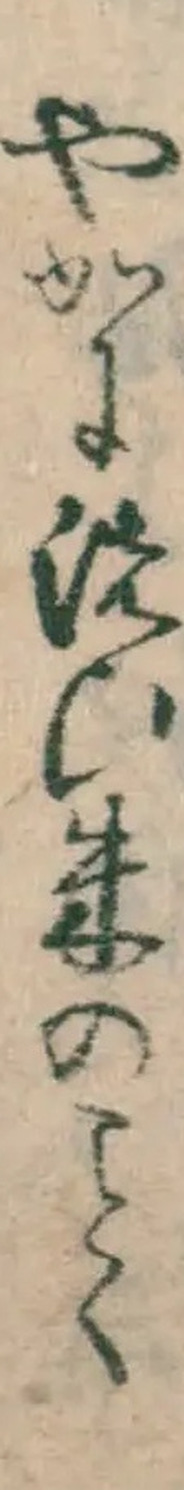やかに洗い朱のことく
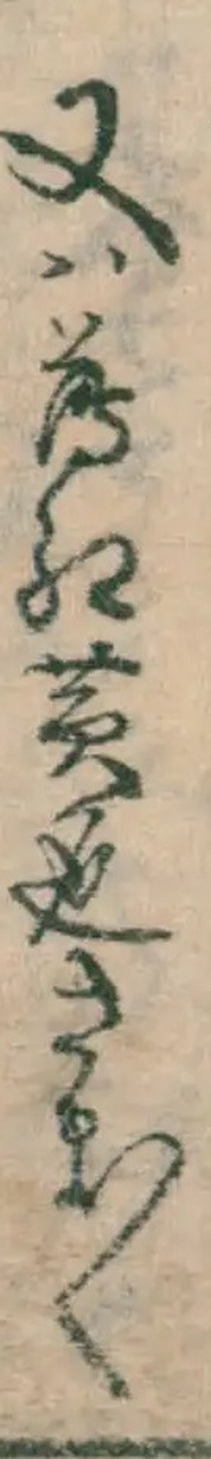又は薄紅黄色さま〳〵
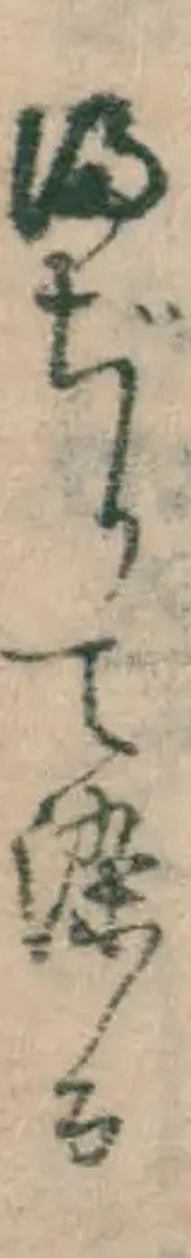まぢりて染る

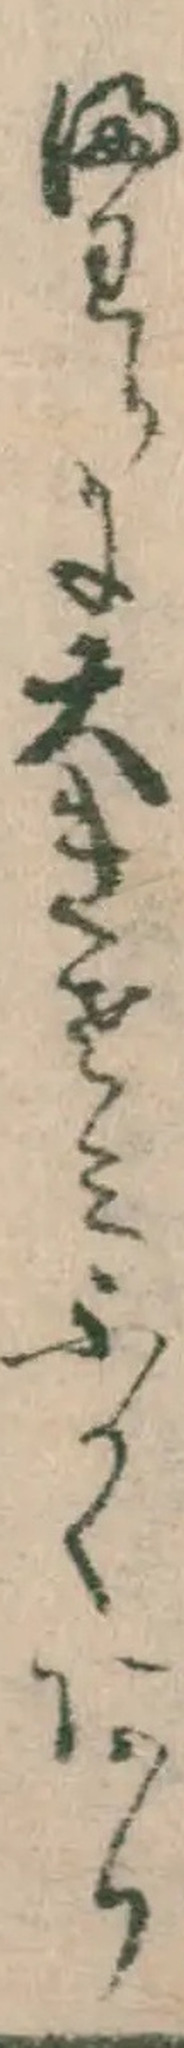まわりに大きさみふかくあり
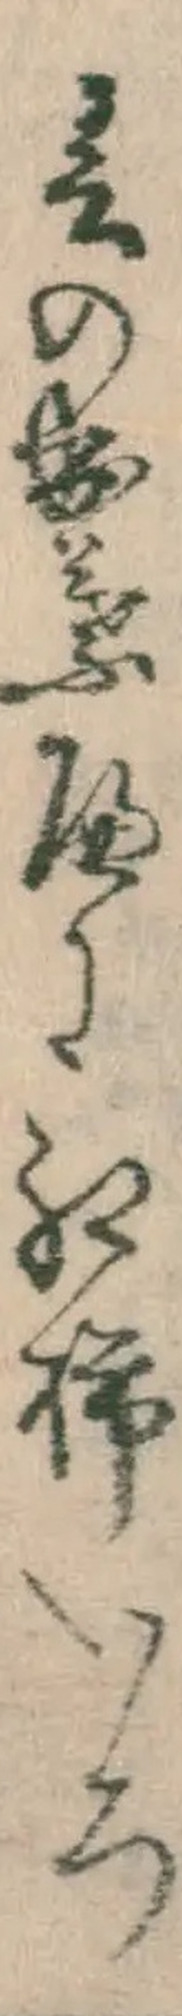春の出葉へに紅柿いろ
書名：紅葉集
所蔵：国立国会図書館 National Diet Library, JAPAN
